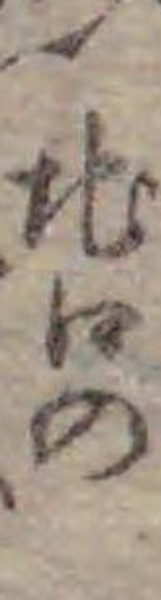地口の
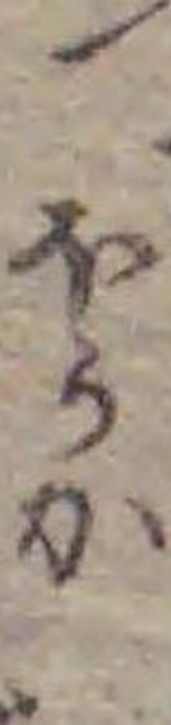ほうか
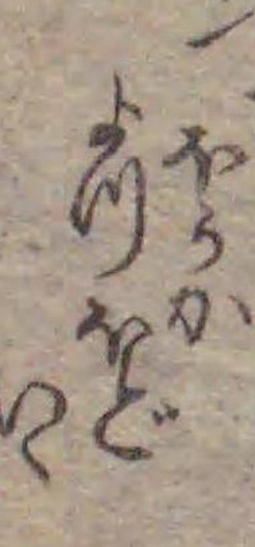よつほど

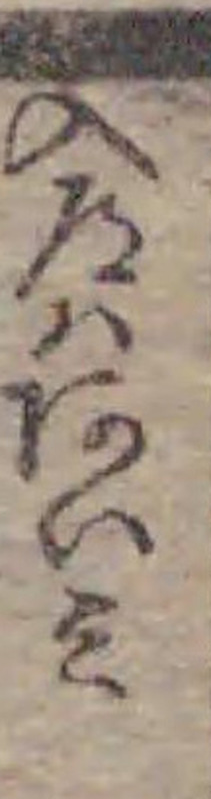入道はあいみ
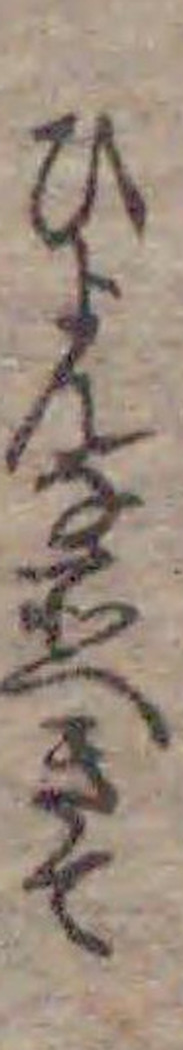ひよんな所へきて
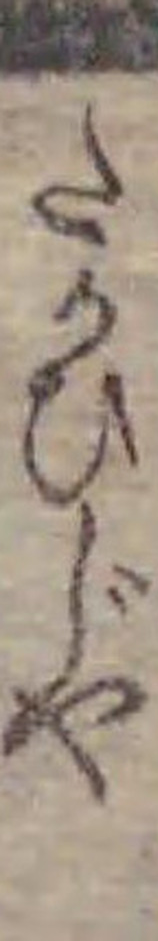たかひじや
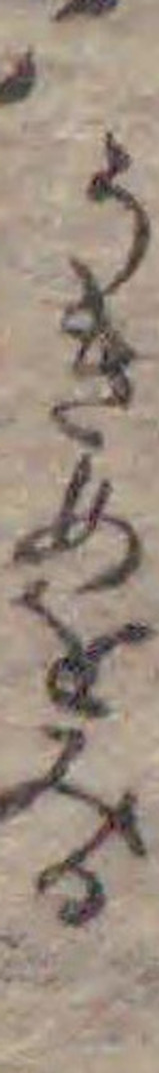うきめをみる
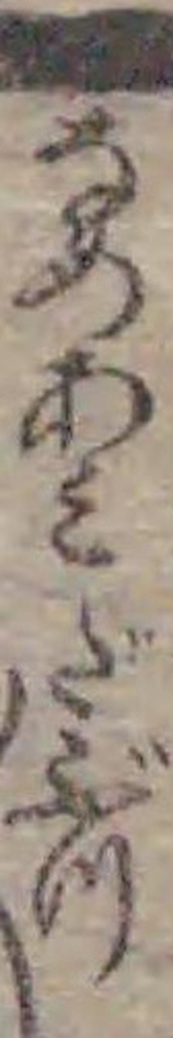なめあみだぶつ
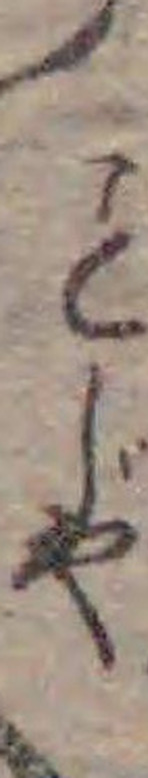ことじや
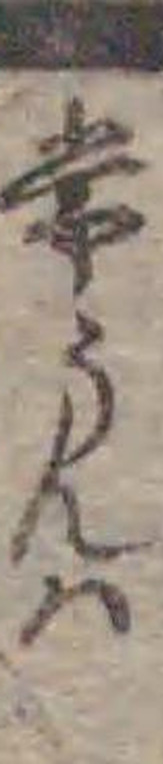常うんは
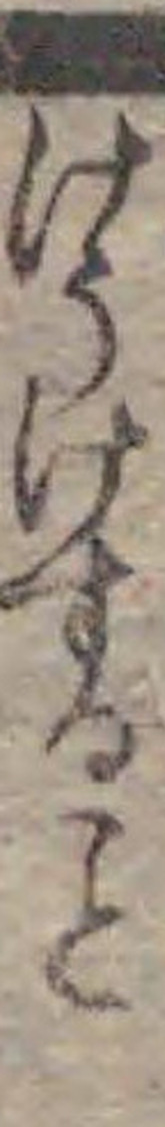けうけすること
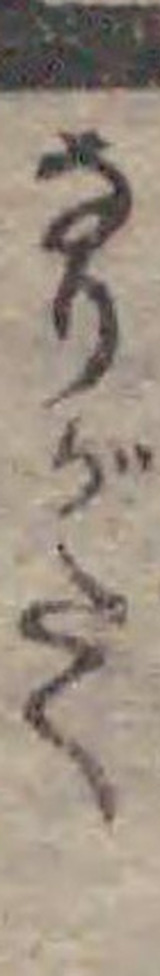なりがたく
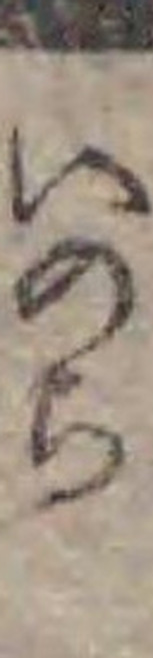いのち
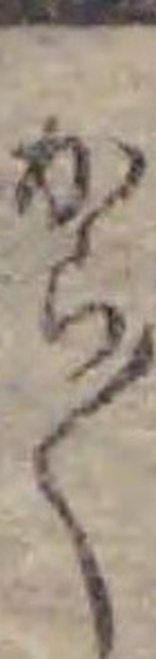から〳〵
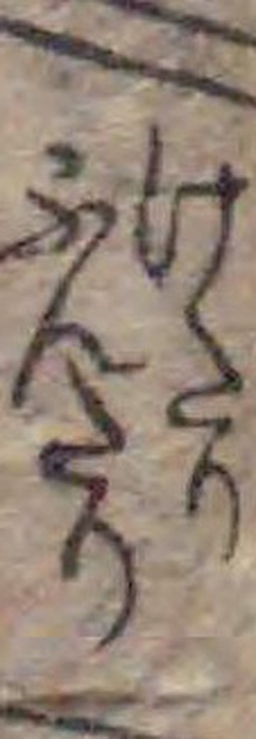ふんたり
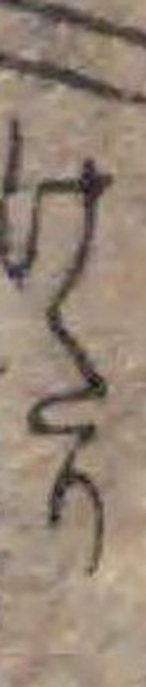けたり
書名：歌の化物一寺再興 : 2巻
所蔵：国立国会図書館 National Diet Library, JAPAN
